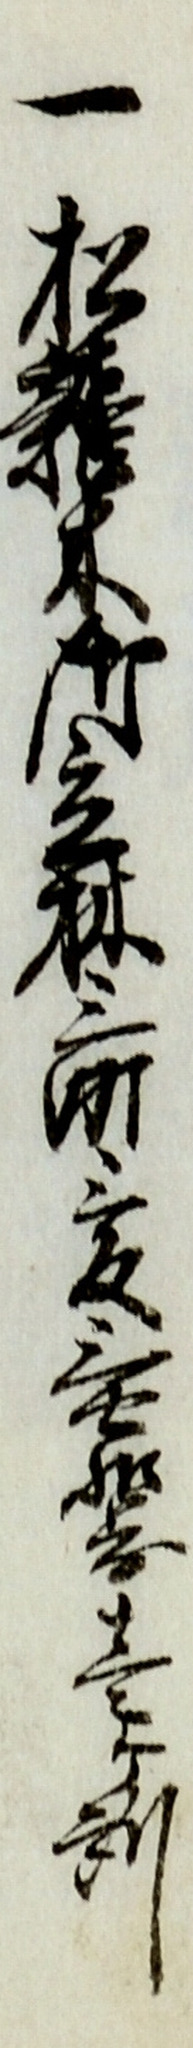一松雑木御立林三町三反三セ拾歩壱ヶ所
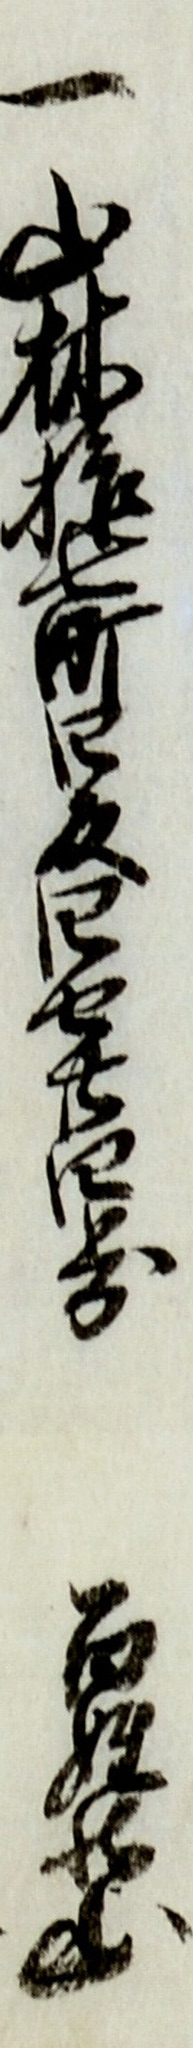一山林拾七町四反四セ廿四歩百姓持山
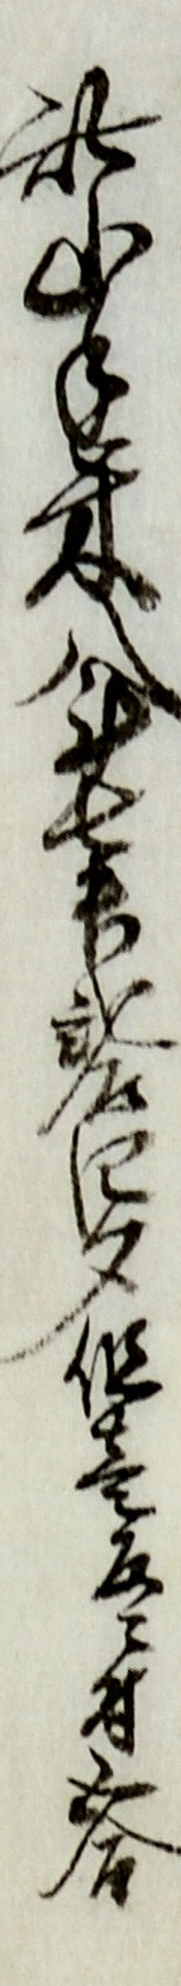此山手米八斗七升弐合四勺但壱反ニ付五合
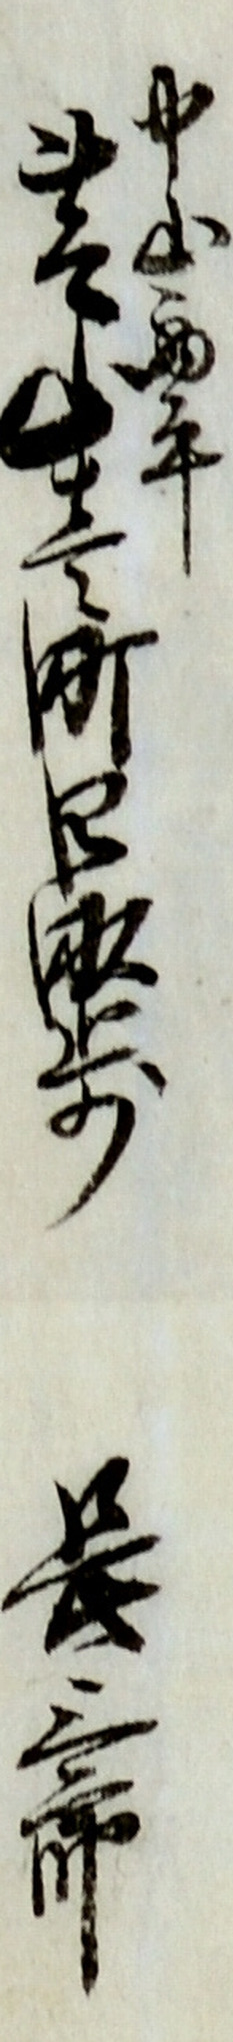芝山壱町四畝歩長三郎

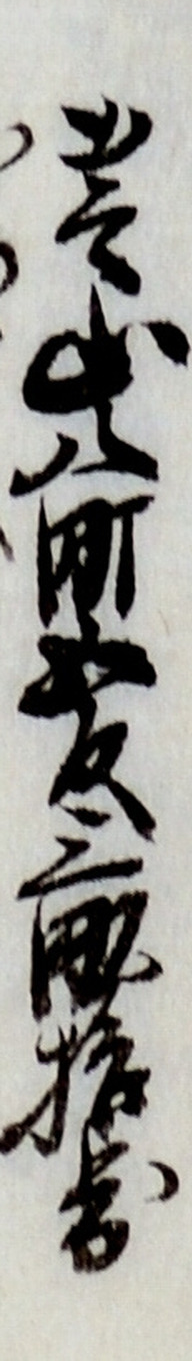芝山八町五反三畝拾歩村中
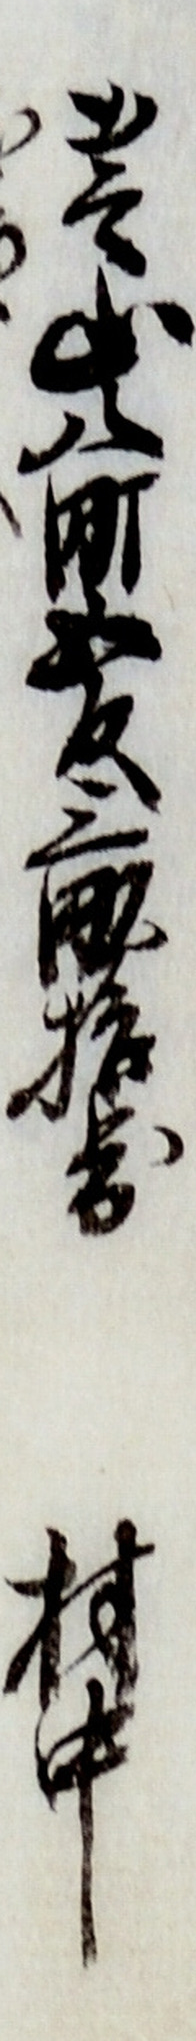芝山八町五反三畝拾歩村中
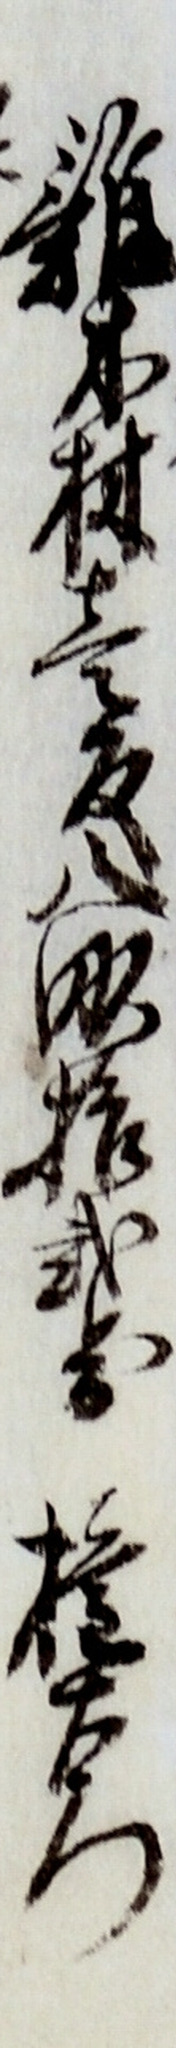雑木林壱反八畝拾弐歩権右衛門
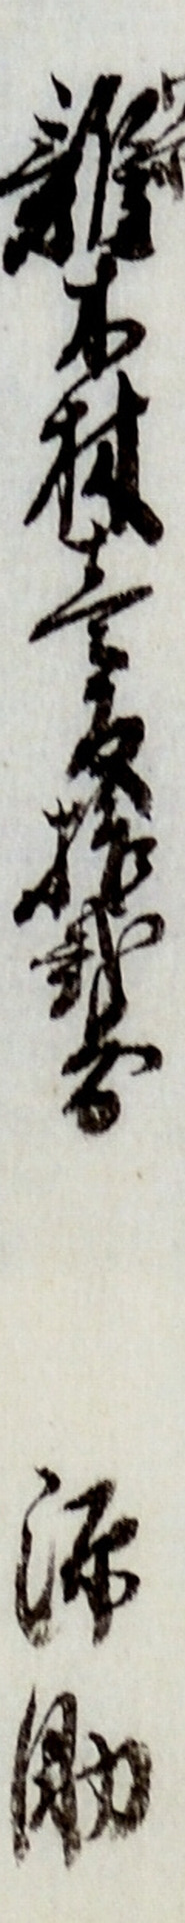雑木林壱反拾弐歩源助
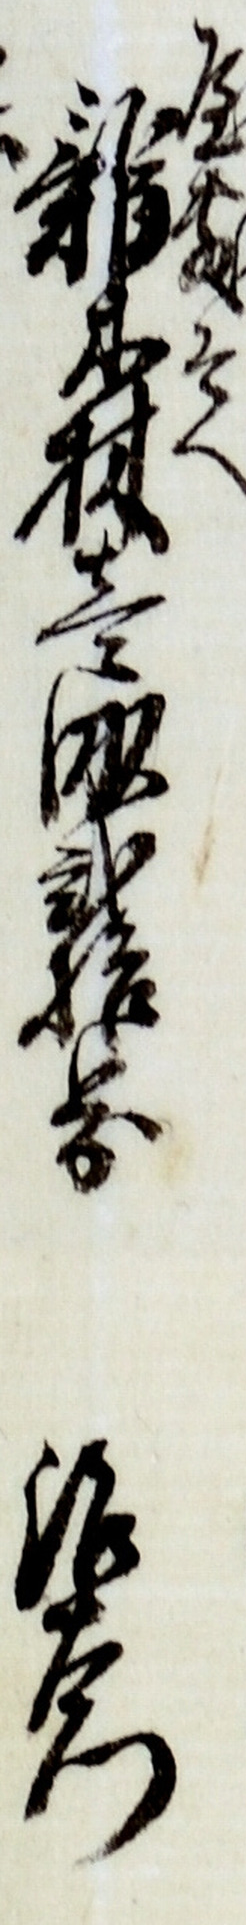雑木林壱畝弐拾歩治右衛門
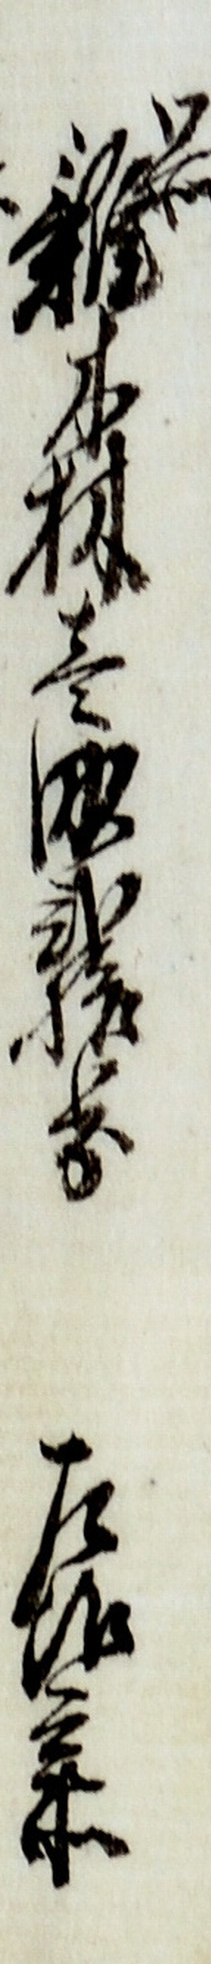雑木林壱畝弐拾歩左治兵衛
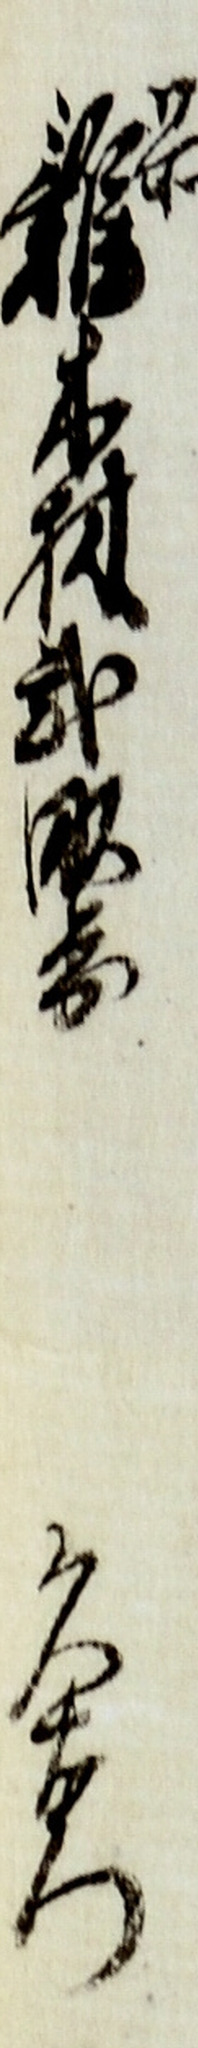雑木林弐畝歩久右衛門
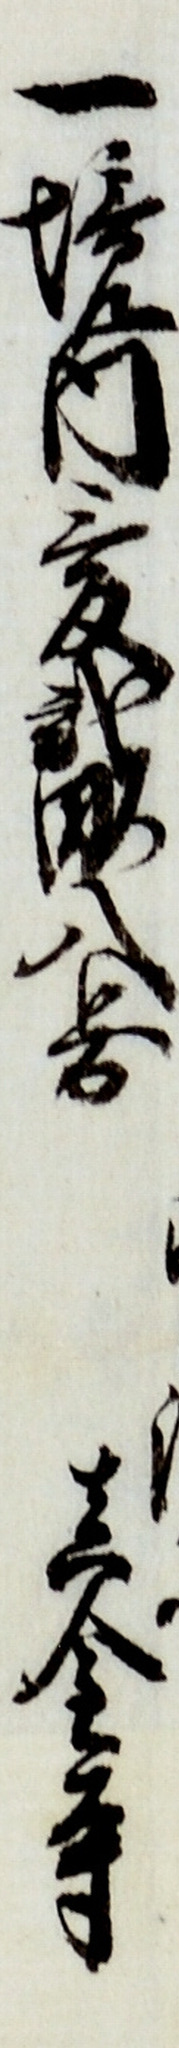一境内三反弐畝八歩真金寺
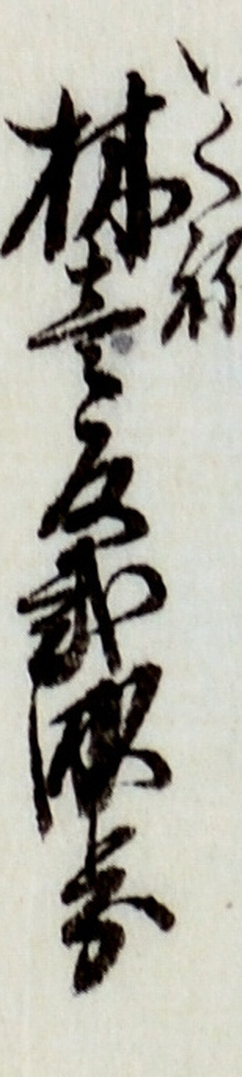林壱反弐畝歩同寺
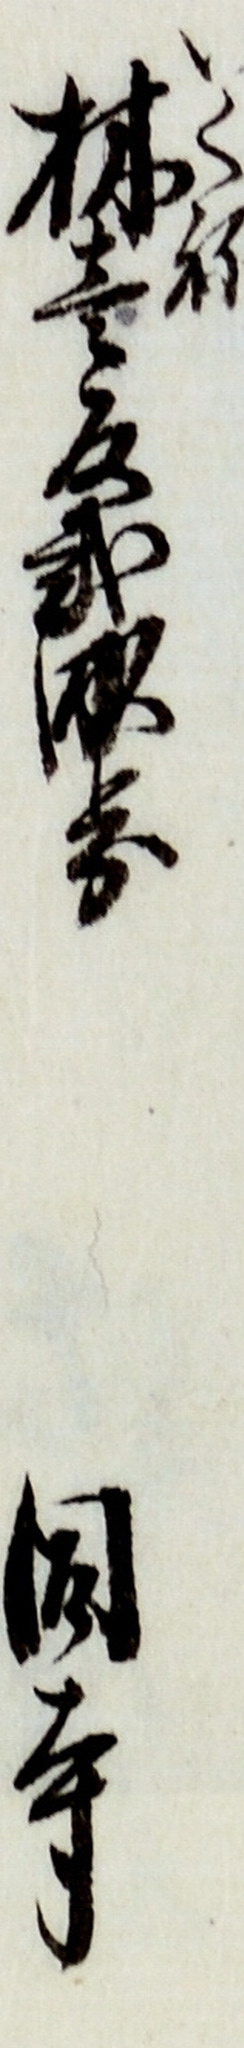林壱反弐畝歩同寺
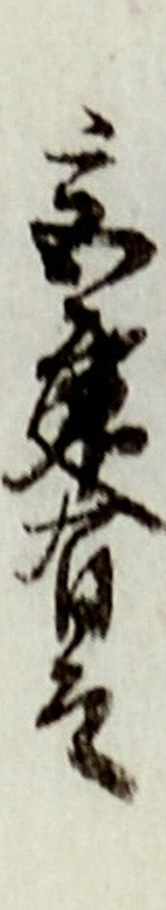宮建有之
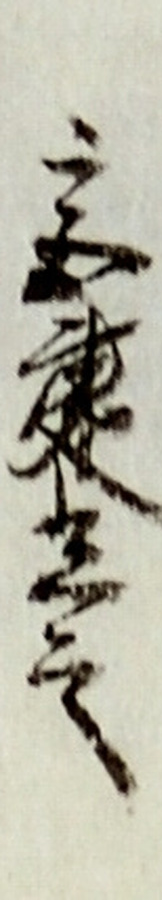宮建有之
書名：御領分中山林社地手控
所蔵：伊那市立高遠町図書館・合同会社AMANE
